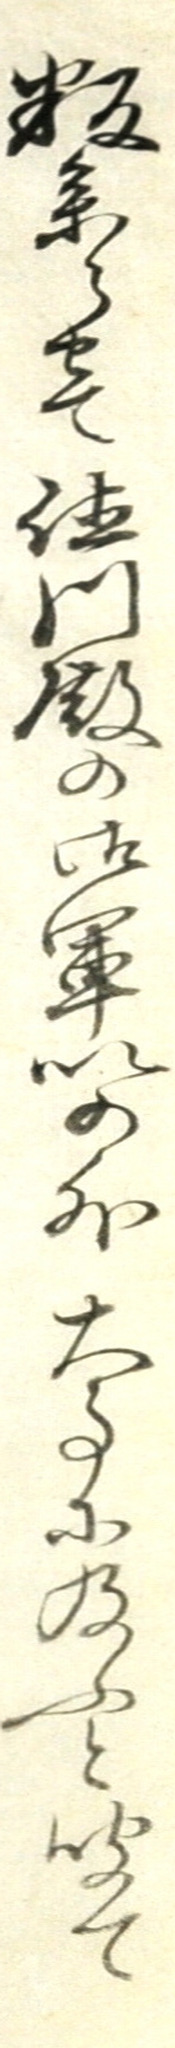数参らせて徳川殿の御軍以の外大事に及ふと聞て
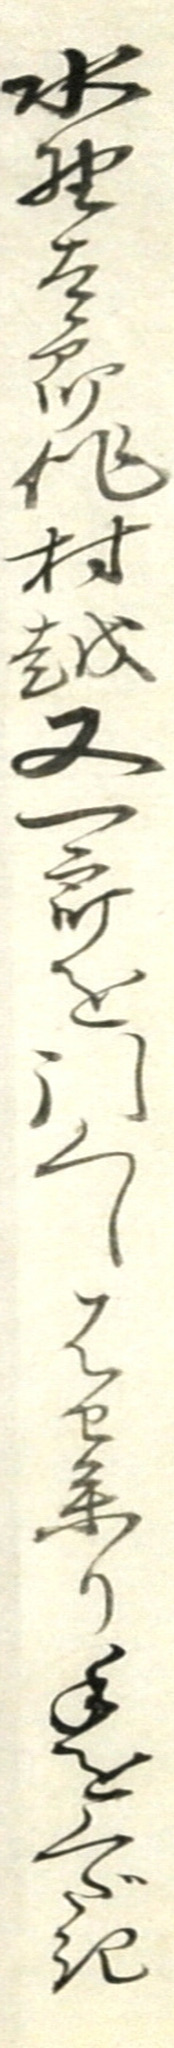水野太郎作村越又一郎を引くしはせ参り手をくだき
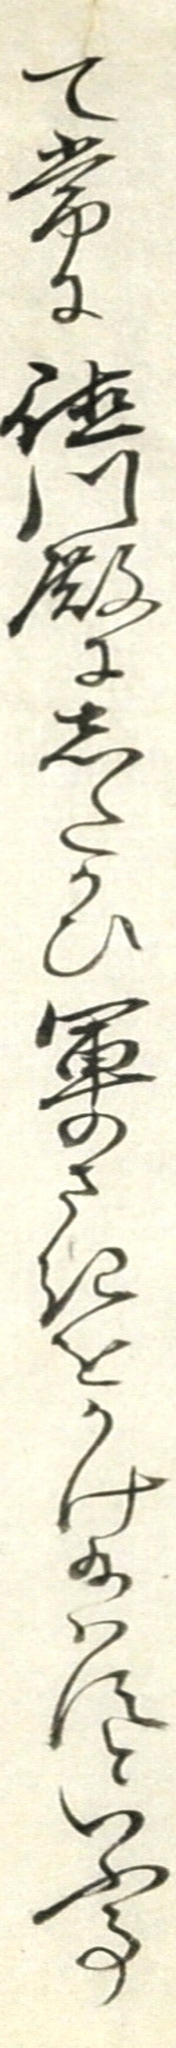て常に徳川殿にしたかひ軍のさきをかけ給はすといふ事
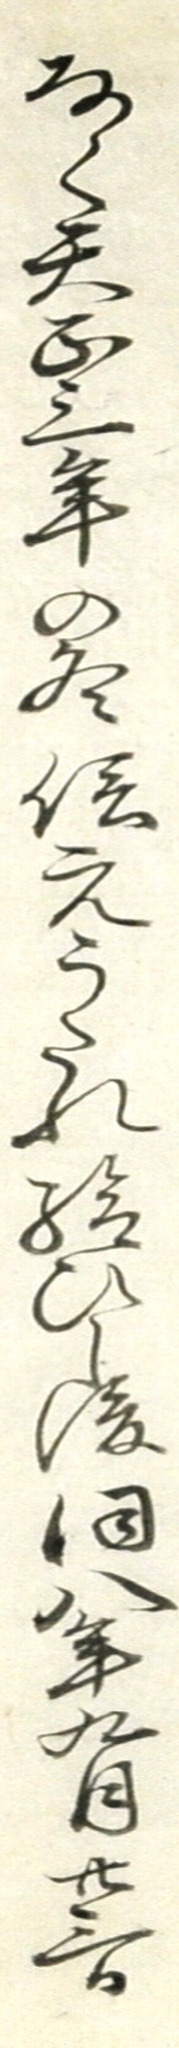なく天正三年の冬信元うたれ給ひし後同八年九月廿三日
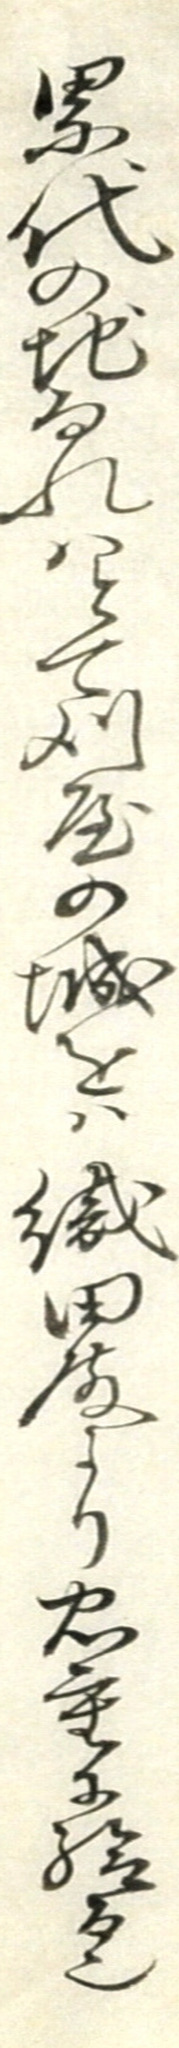累代の地なれはとて刈屋の城をは織田殿より忠重に給る也
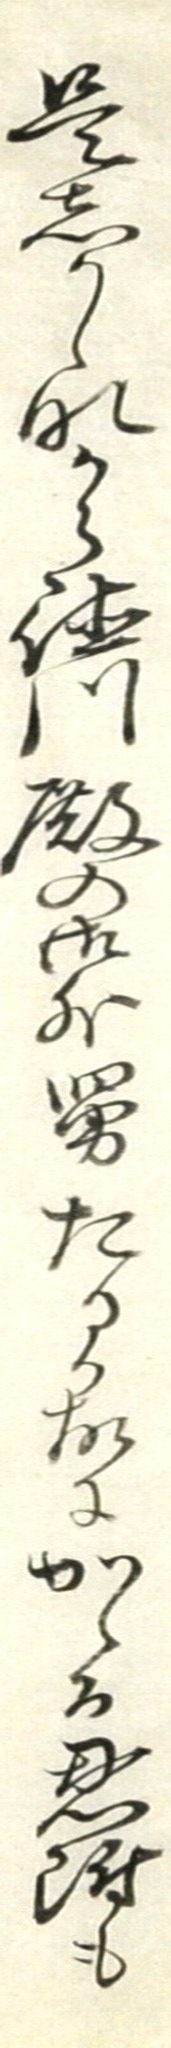是しかしなから徳川殿の御外舅たるか故にかゝる恩付も
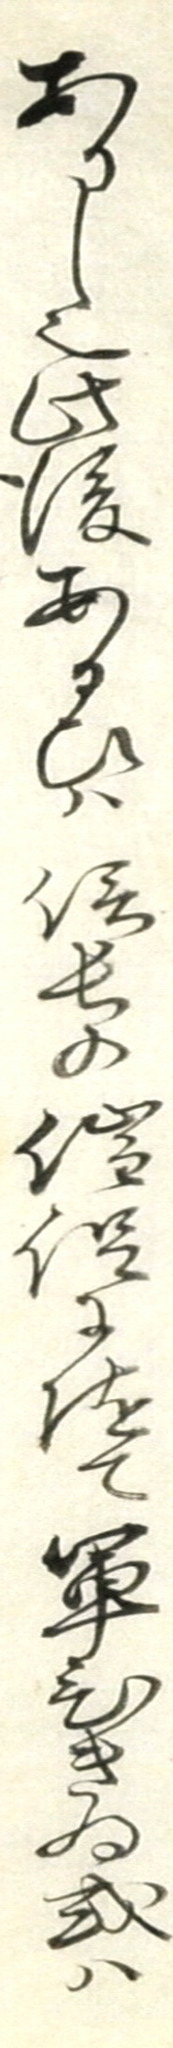ありし也此後あるひは信長の催促に随て軍ひきゐ或は
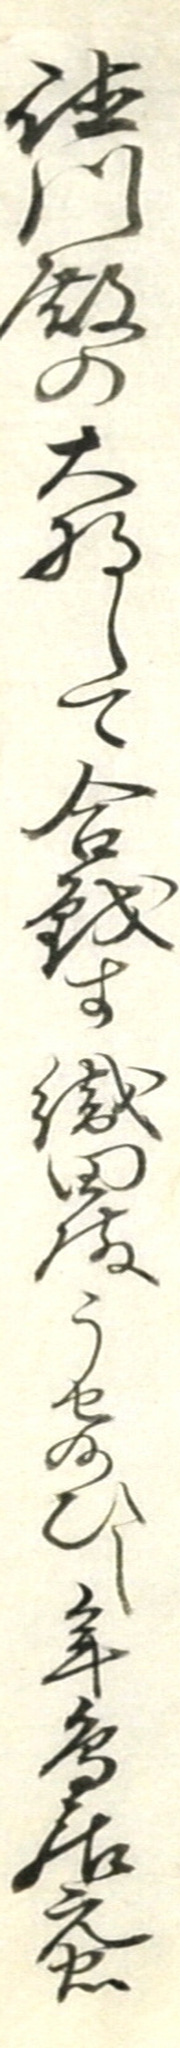徳川殿の大将して合戦す織田殿うせ給ひし年鳥居元忠
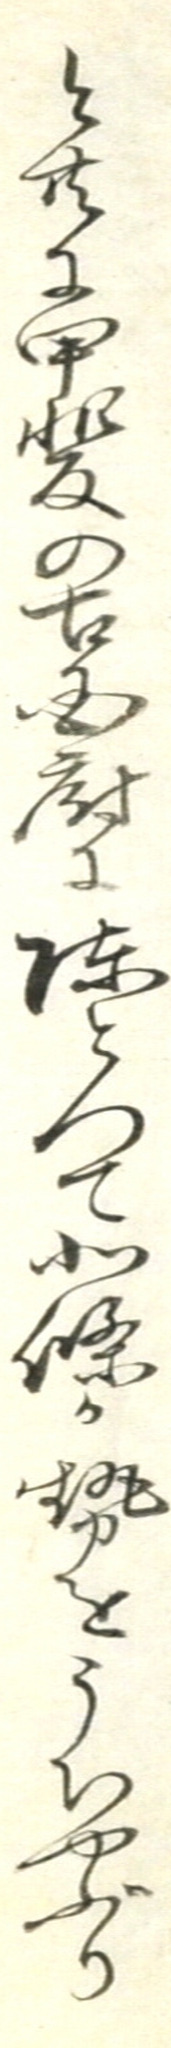と共に甲斐の古国府に陣とつて北条か勢をうちやぶり
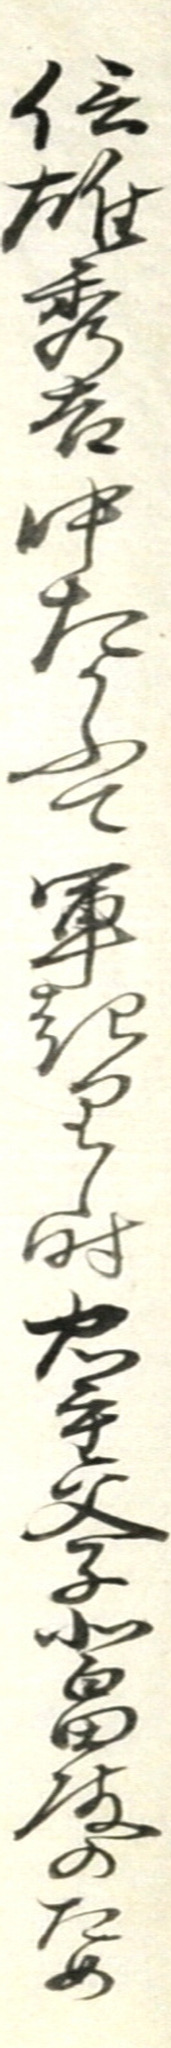信雄秀吉中たかふて軍起りし時忠重父子北畠殿のため
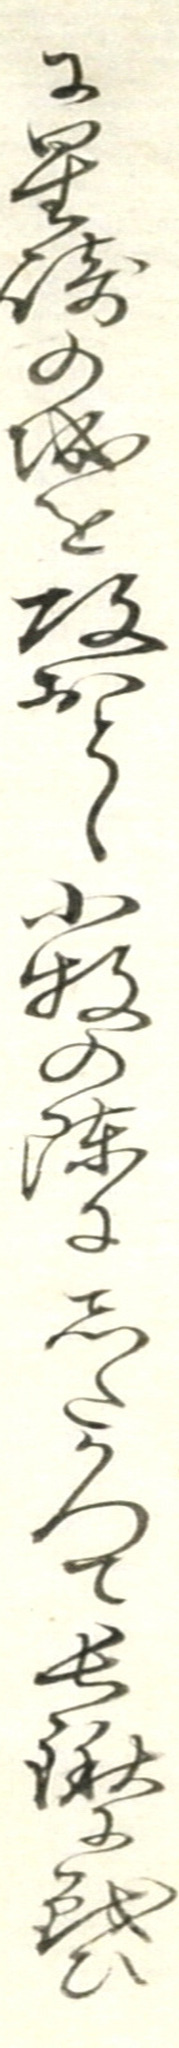に星崎の城を攻おとし小牧の陣にしたかつて長鍬に戦ひ
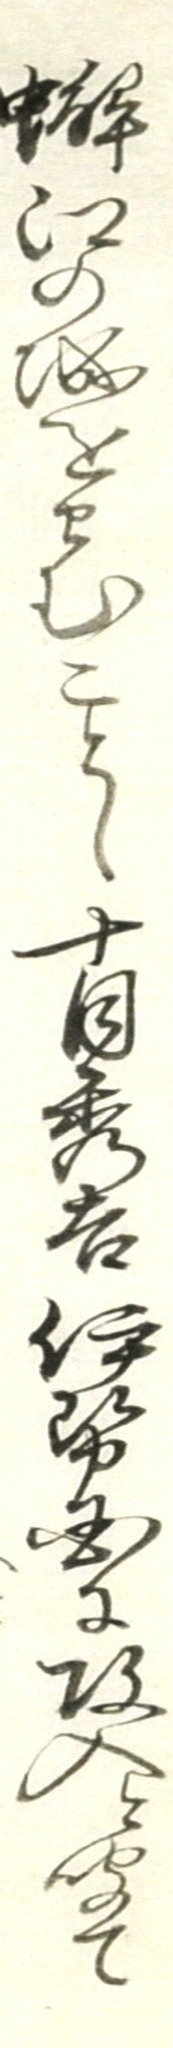蟹江の城をせむことし十月秀吉伊勢国に攻入と聞て
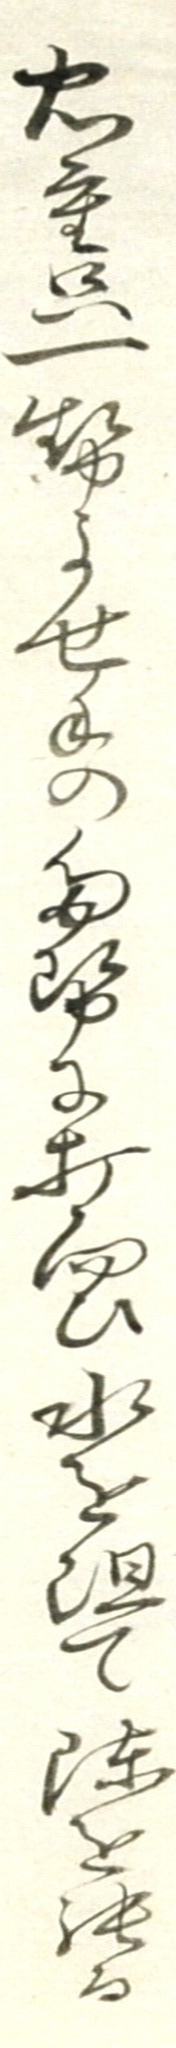忠重只一勢よせ手の多勢に打向ひ水を阻て陣を張る
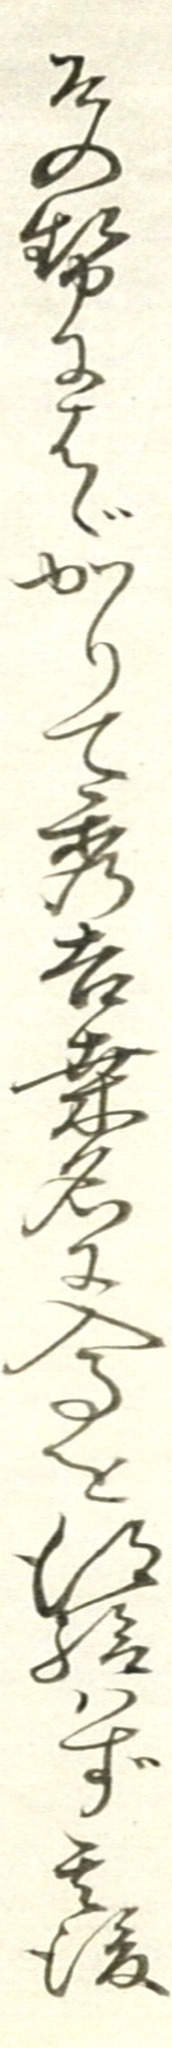その勢にはゞかりて秀吉桑名に入事を得給はず其後
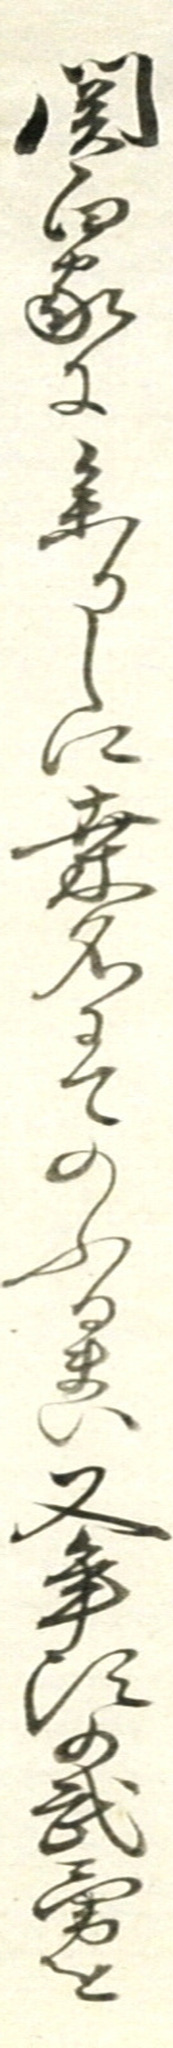関白家に参りしに桑名にてのふるまい又年頃の武勇を
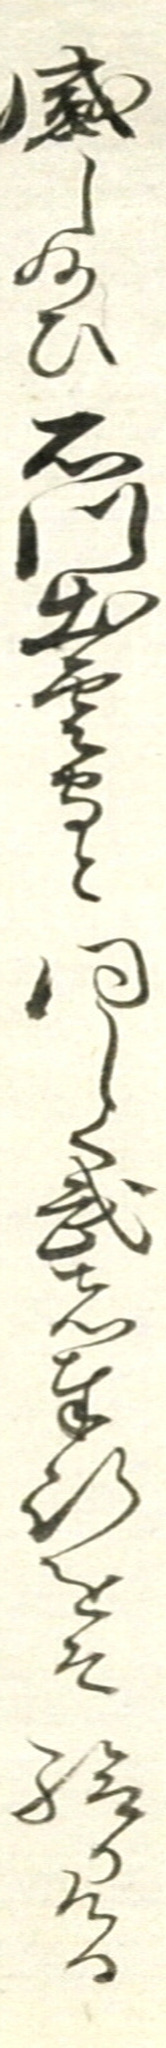感し給ひ石川出雲守と同しく武者奉行をそ給りける
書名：藩翰譜（二・三）
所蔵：伊那市立高遠町図書館・合同会社AMANE
